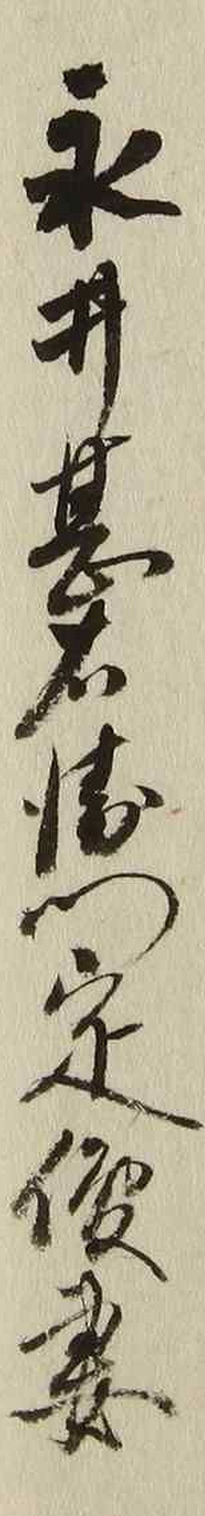女永井甚右衛門定俊妻
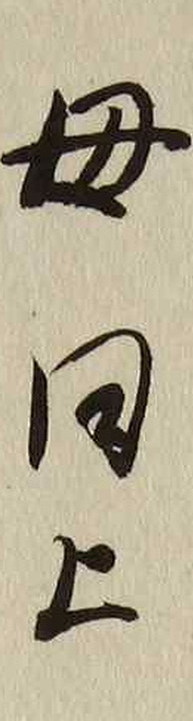母同上
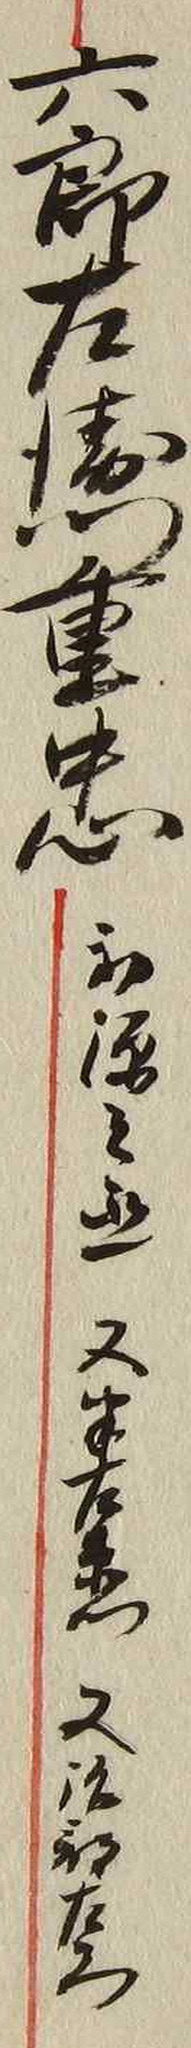六郎左衛門重忠初源之丞又半左衛門又治部左衛門
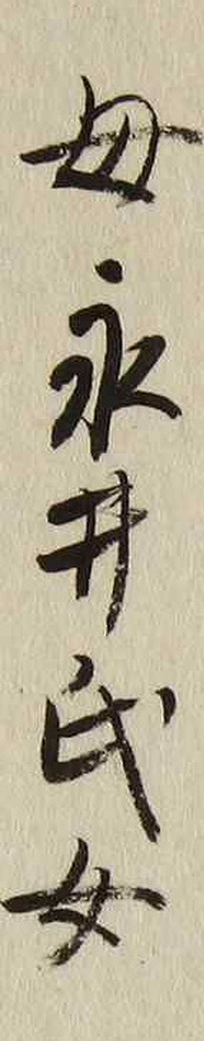母永井氏女
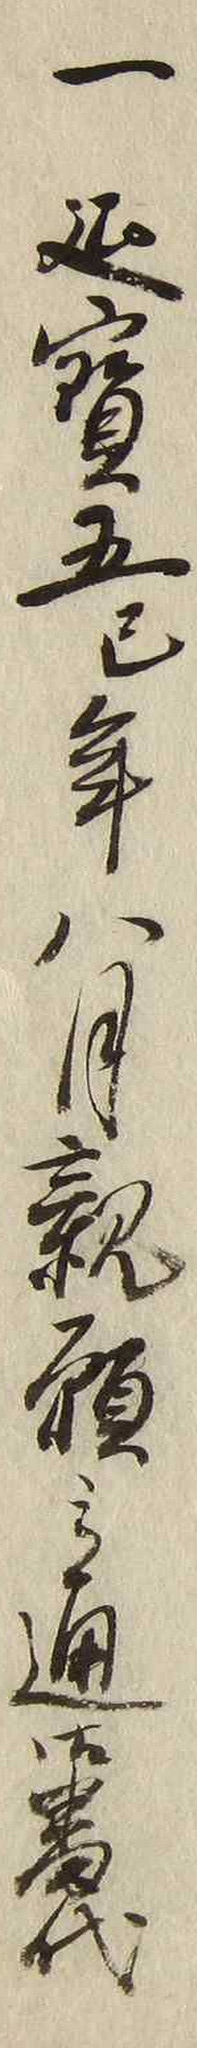一延宝五巳年八月親願之通番御代

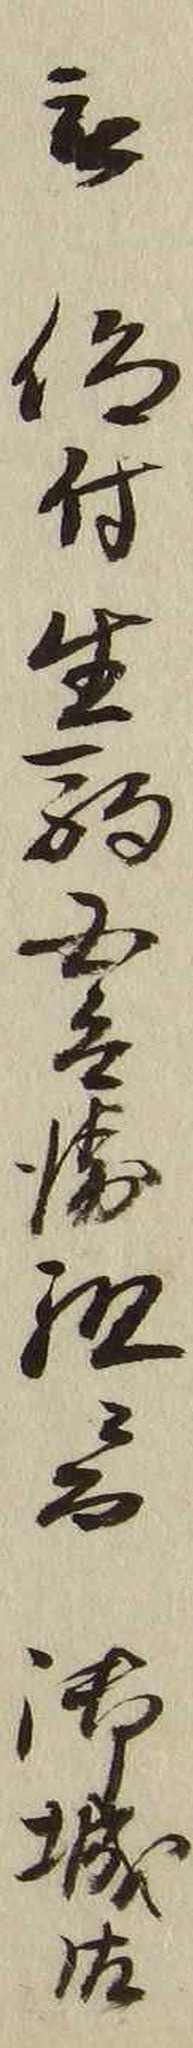被仰付生駒五兵衛組ニ而御城御
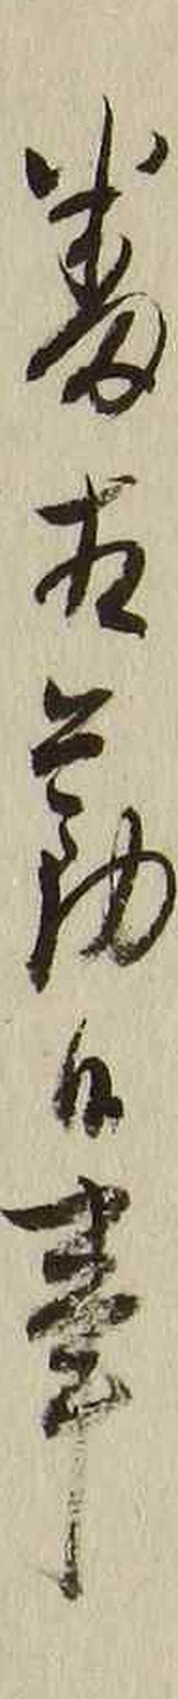番相勤候事
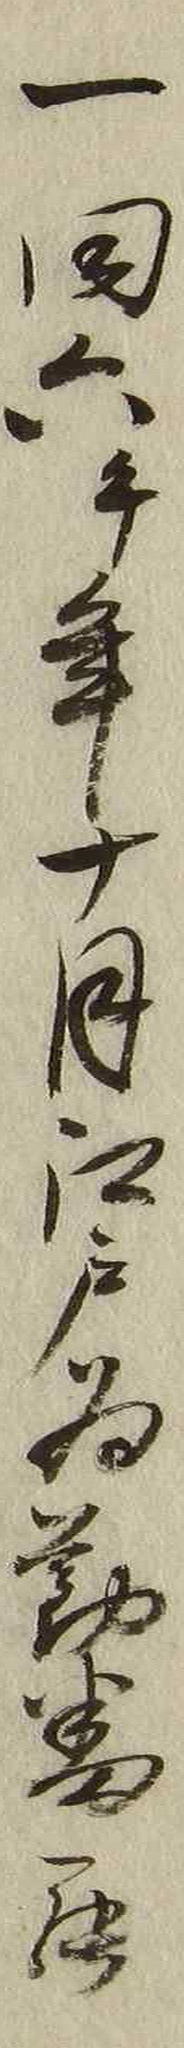一同六午年十月江戸為勤番罷
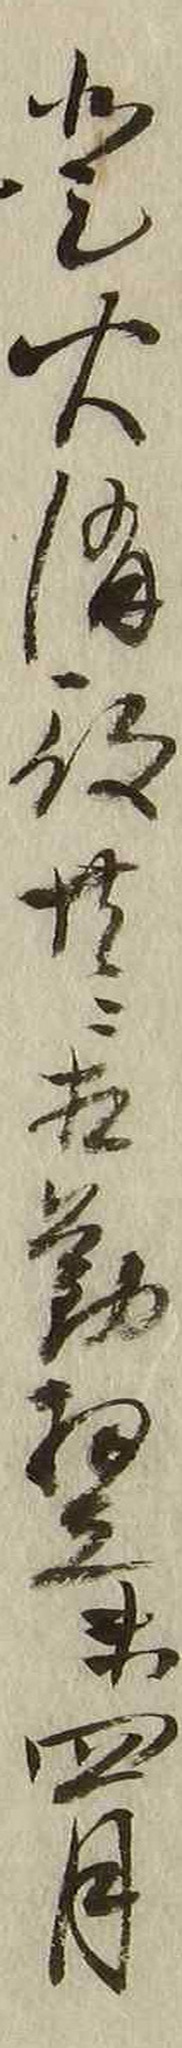登火消役共ニ相勤翌未四月
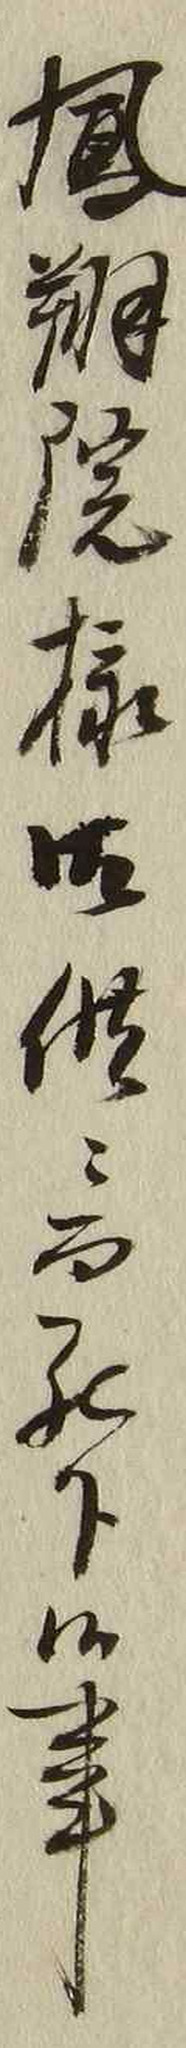鳳翔院様御供ニ而罷下候事
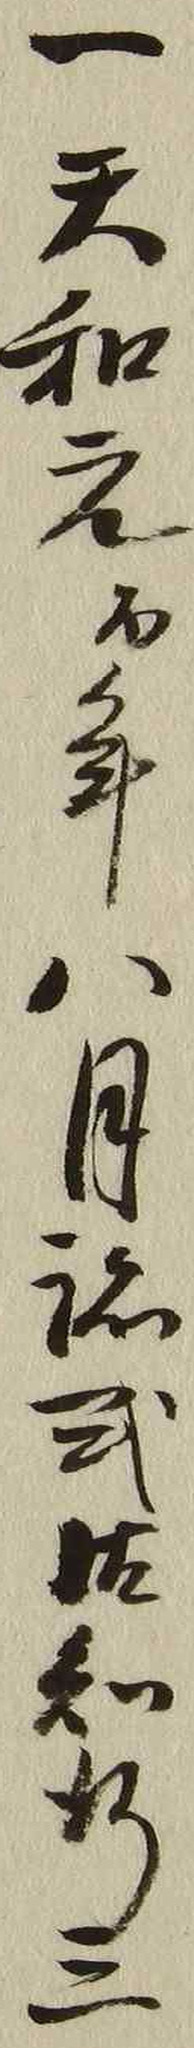一天和元酉年八月跡式御知行三
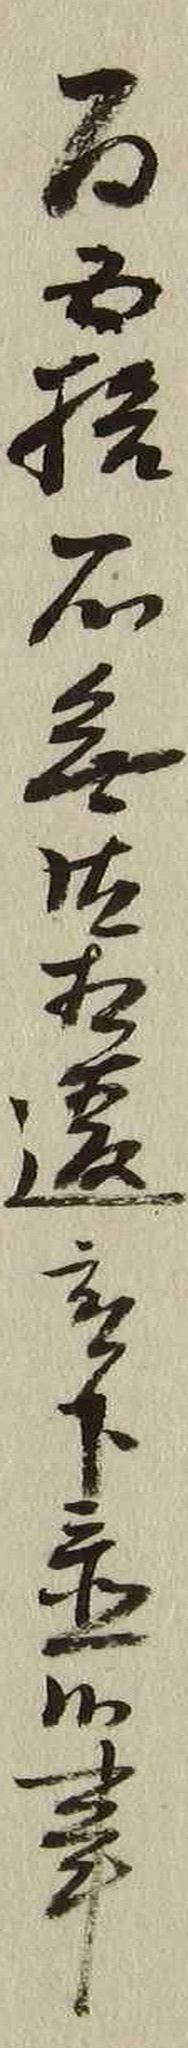百五拾石無御相違被下置候事
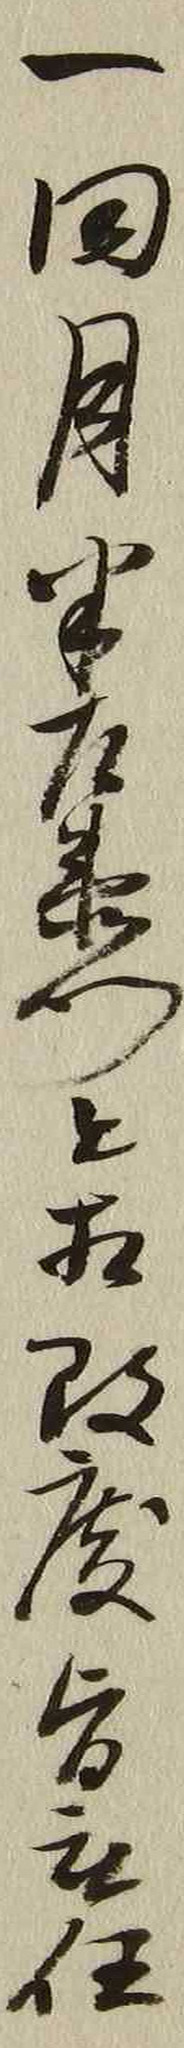一同月半左衛門と相改度旨被任
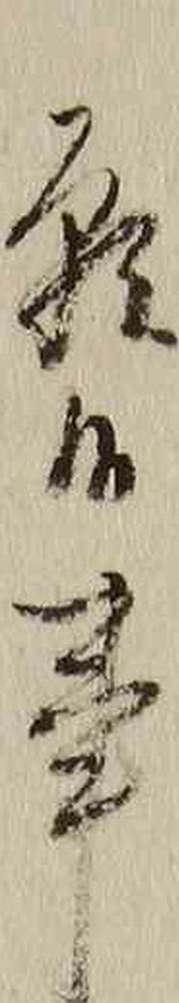願候事
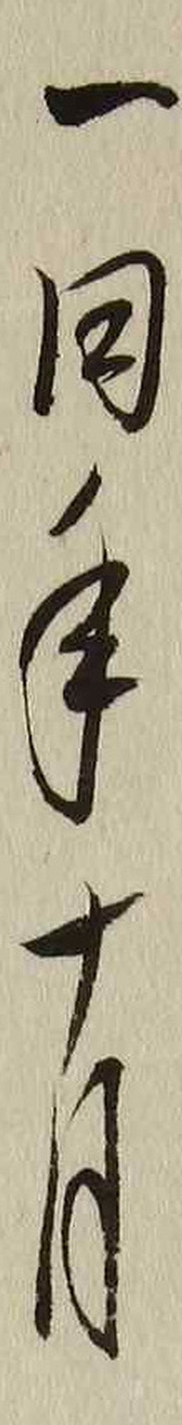一同年十月
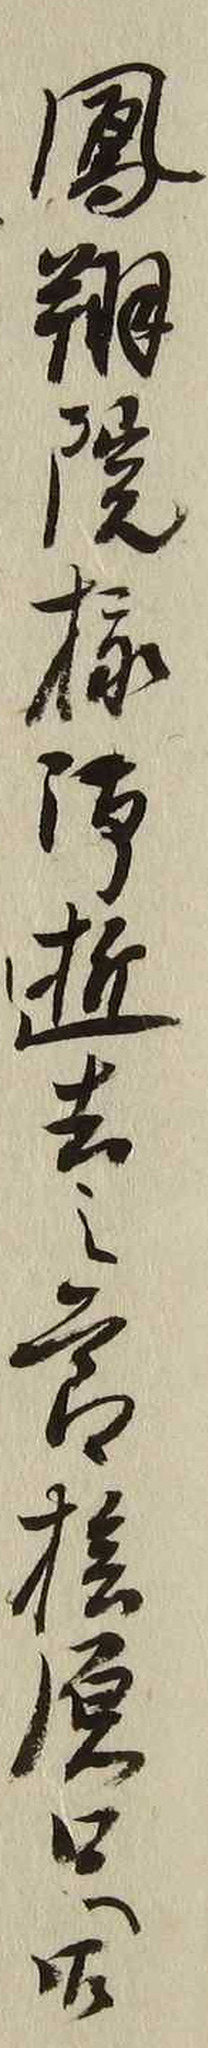鳳朔院様御逝去之節檜原口ヘ御
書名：諸士系譜　巻之355　す之部5
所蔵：会津若松市立会津図書館
